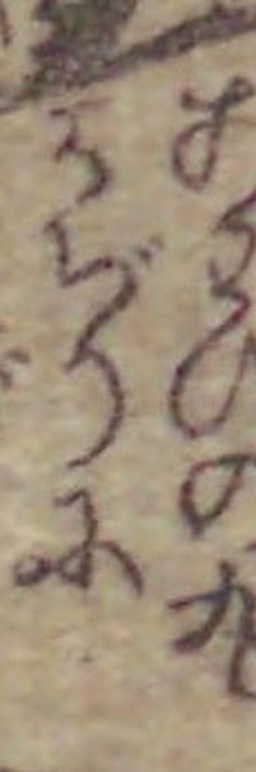かぢりに
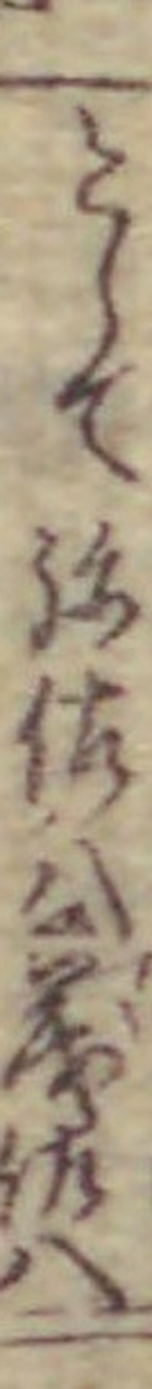として弥作八茂作八
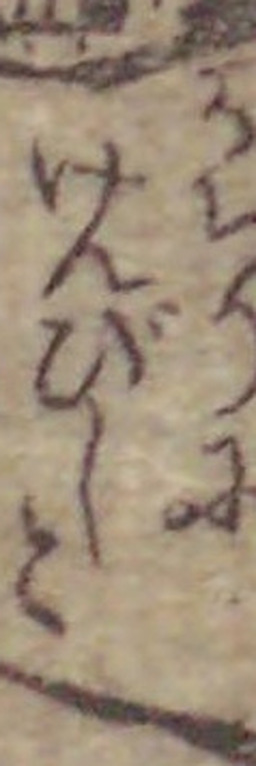けんびしと
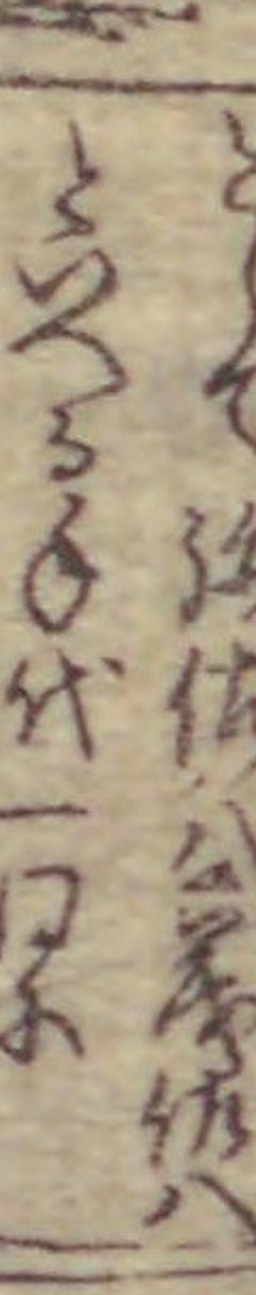といへる手代一同に
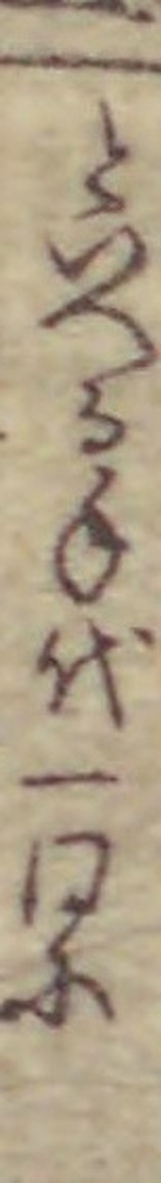といへる手代一同に
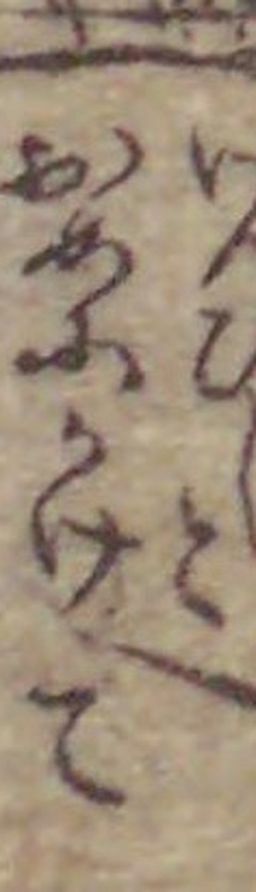おめにかけて
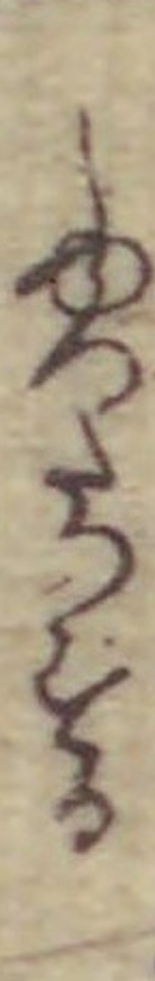しゆつたつする
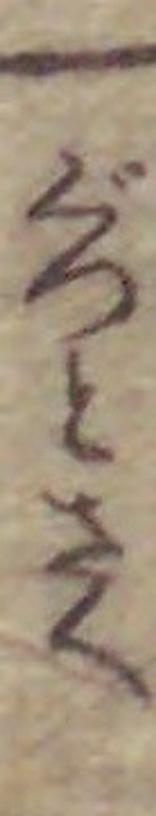ぐつとさく
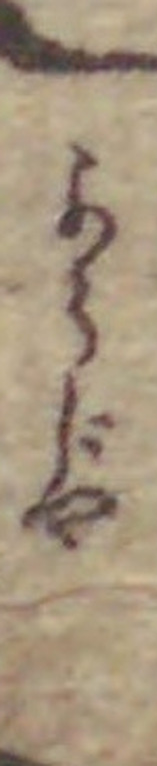ようじや
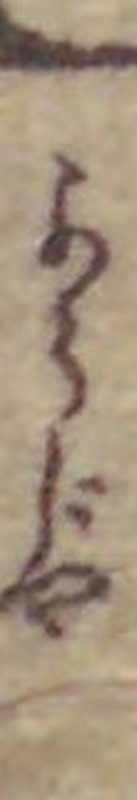ようじや
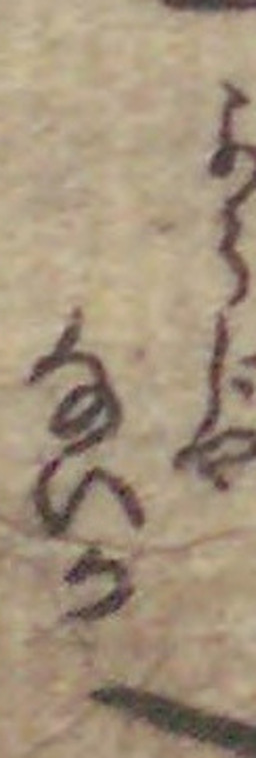ないか

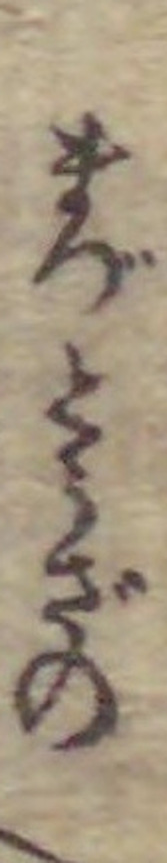まづとうざの
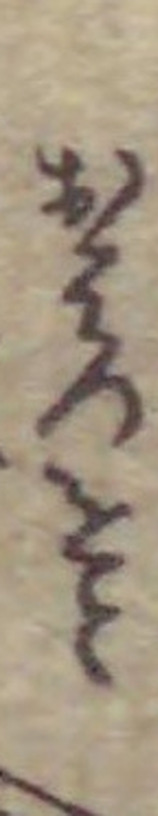おはつをと
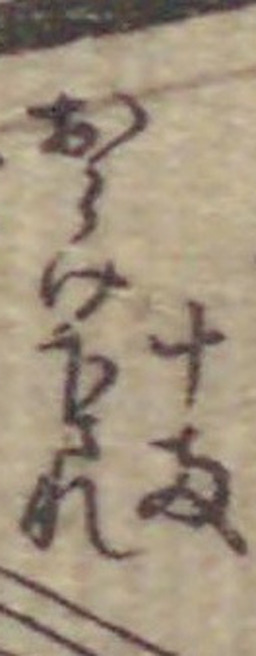おうけ下され
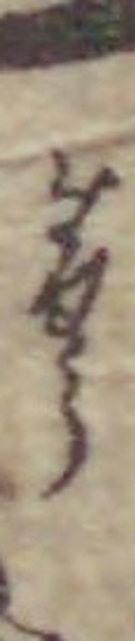ませう
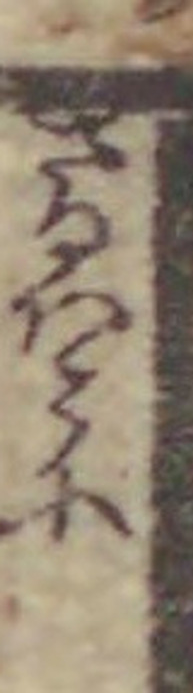さるほとに
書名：止而道致虚録 3巻
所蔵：国立国会図書館 National Diet Library, JAPAN
